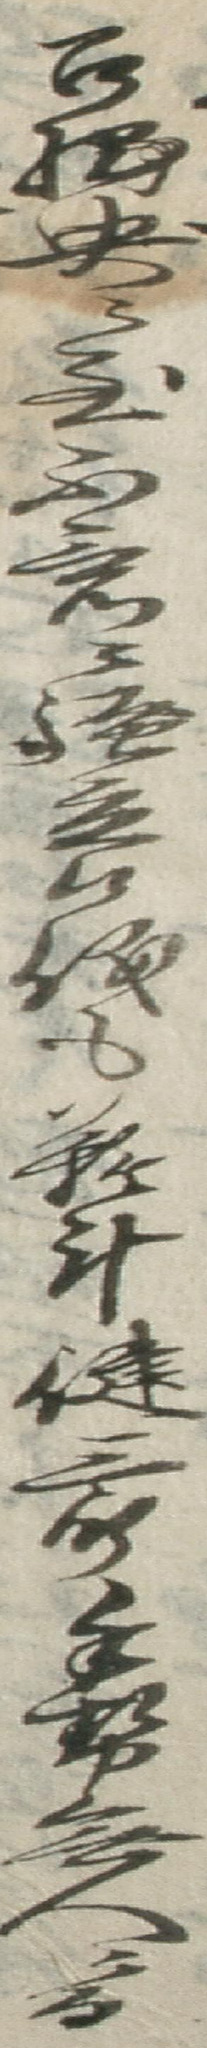召捕央々至不意二騒立候儀も難計健三郎手勢無人二而
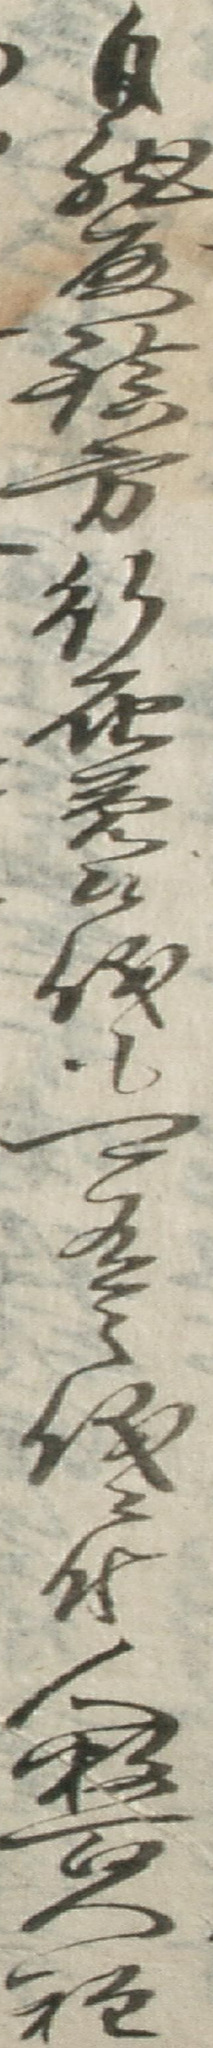自然取鎮方行届兼候儀も可有之儀二付人数百人程
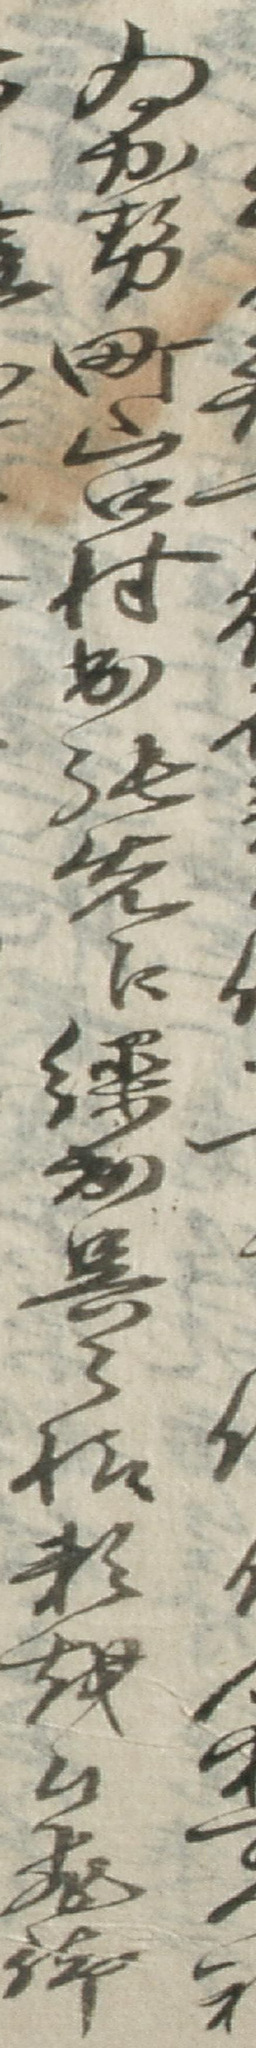為加勢町山口村出張先江繰出呉候様頼越候飛脚
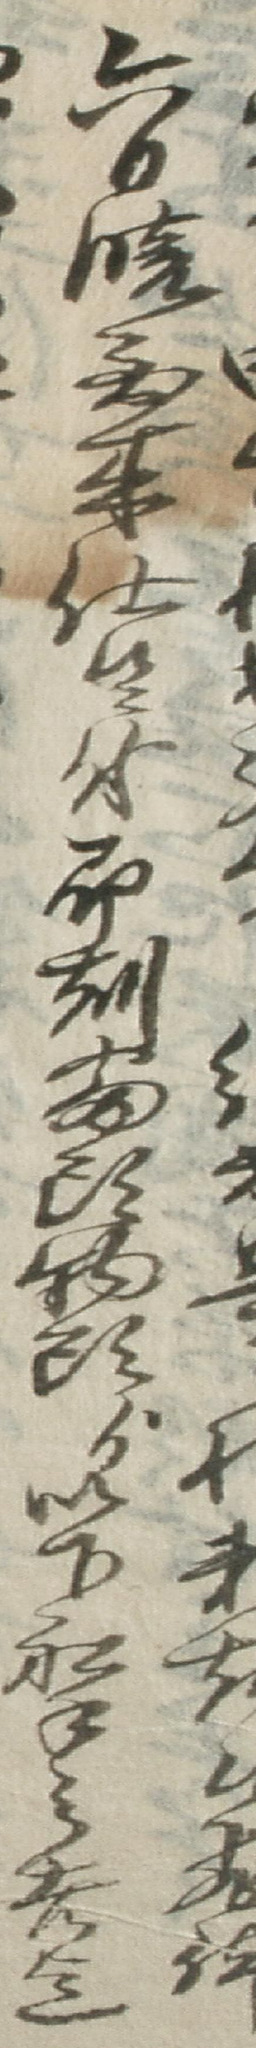六日暁到来仕候二付即刻番頭物頭ゟ以下私手之者迄
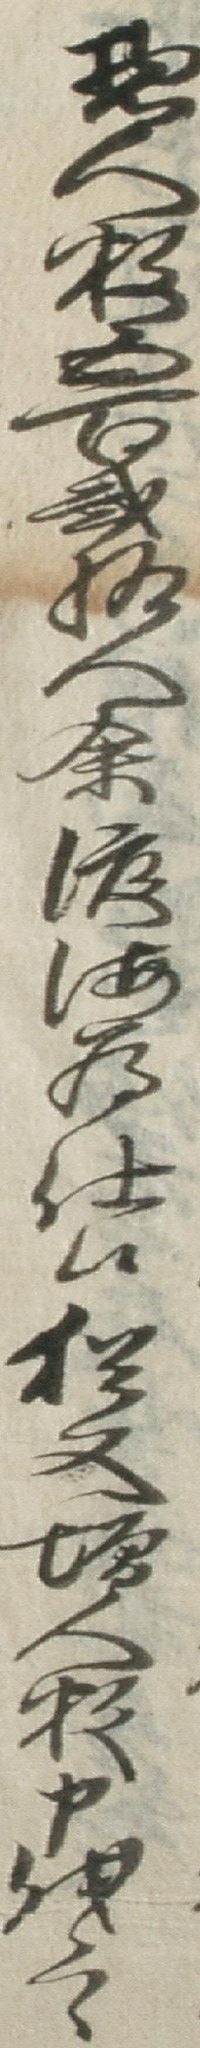惣人数五百弐拾人余渡海為仕候猶又増人数申越候ハゝ
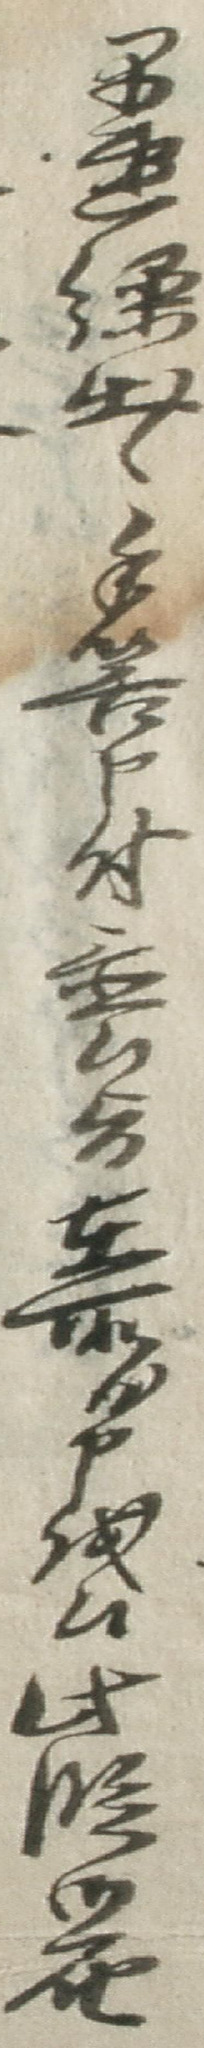早速繰出候手筈申付置候旨在所ゟ申越候此段御届
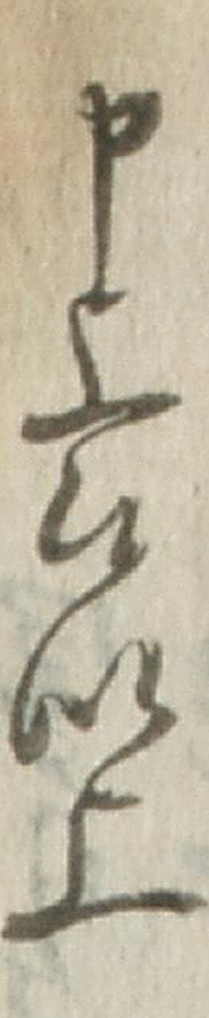申上候以上
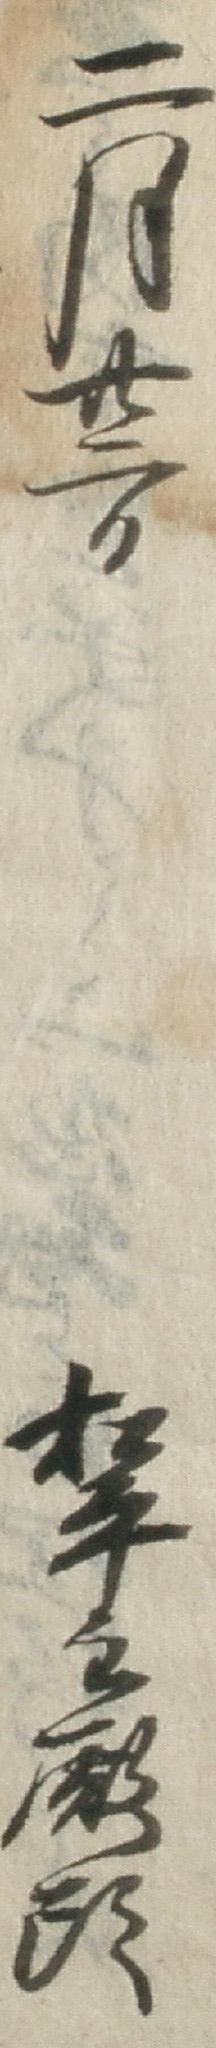二月廿二日松平主殿頭
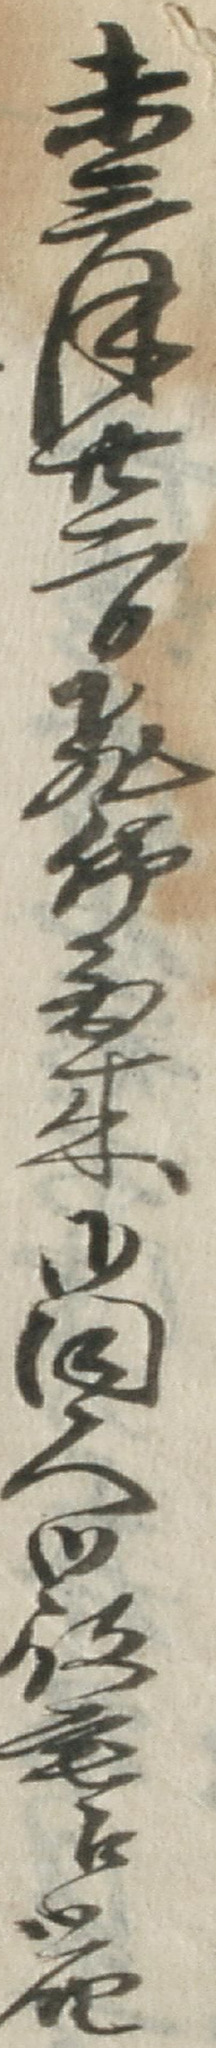未三月廿二日飛脚到来御同人御役宅江御届
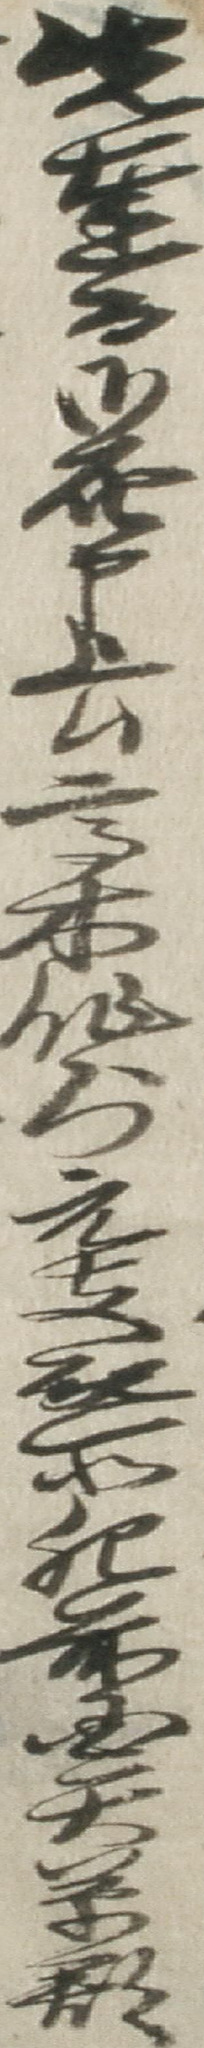先達而御届申上候高木作右衛門元支配所肥前国天草郡
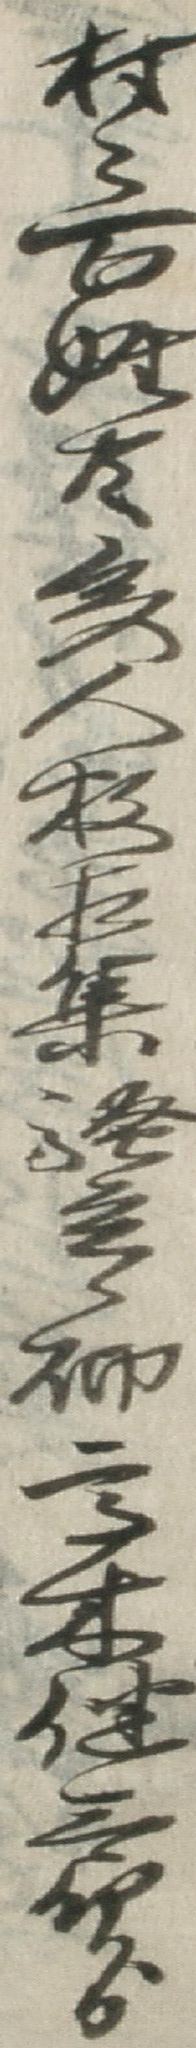村々百姓共多人数相集騒立候砌高木健三郎ゟ
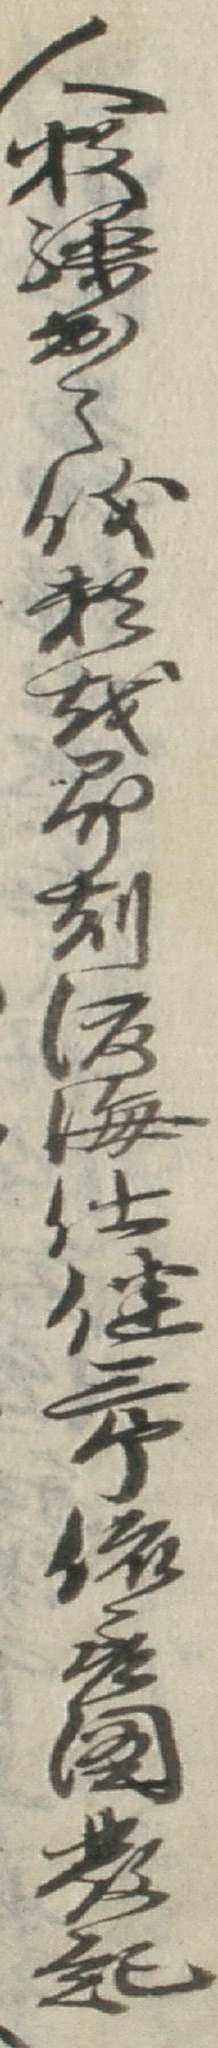人数繰出候儀頼越即刻渡海仕健三郎依差図発起
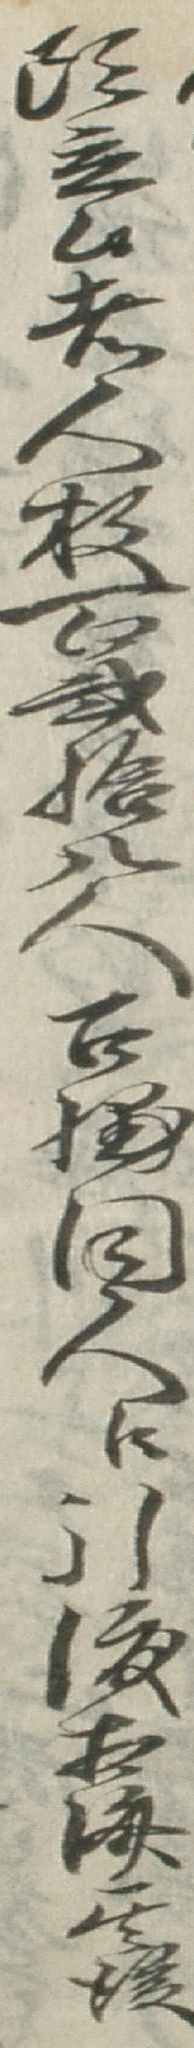頭立候者人数百弐拾八人召捕同人江引渡相済其後
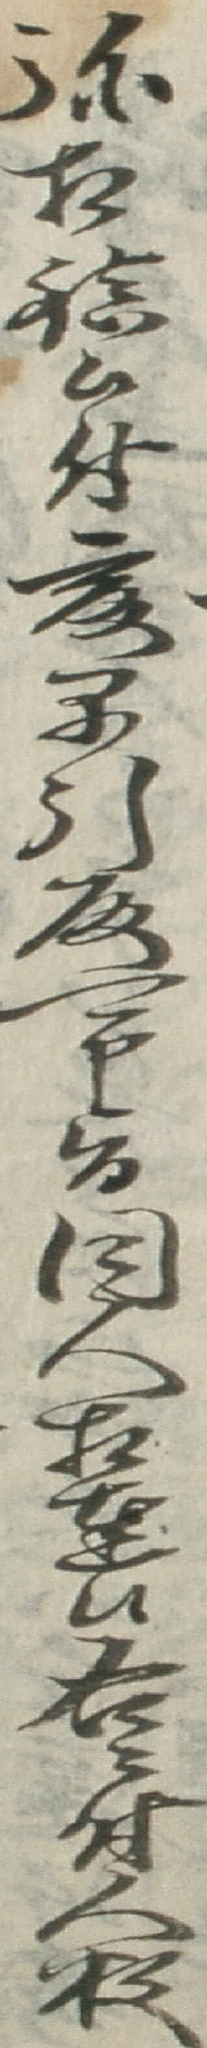弥相鎮候付最早引取可申旨同人相達候右二付人数
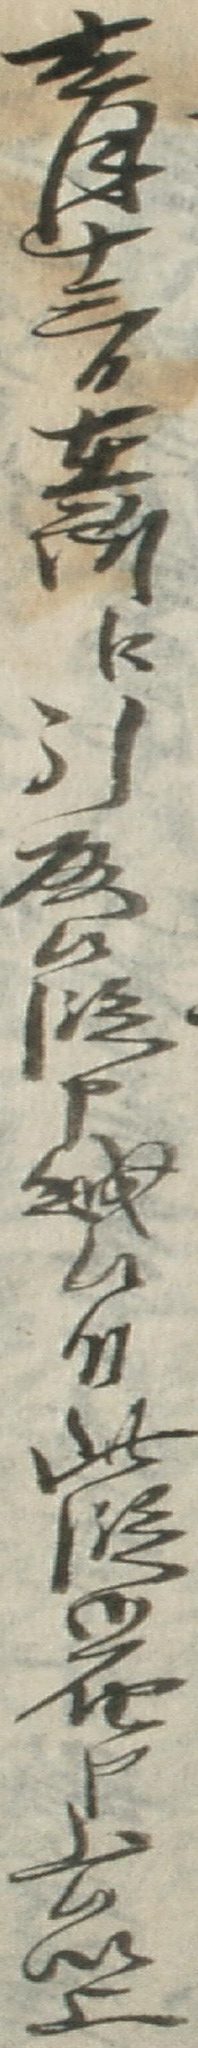去月十三日在所江引取候段申越候付此段御届申上候以上
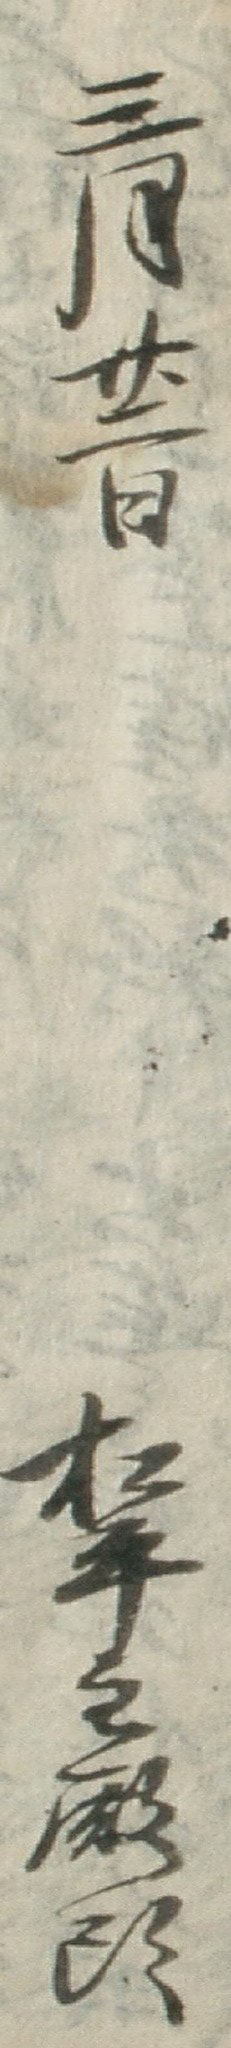三月廿二日松平主殿頭
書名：信濃國地震實録記
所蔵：東京大学地震研究所図書室 Earthquake Research Institute Library, The University of Tokyo, JAPAN
